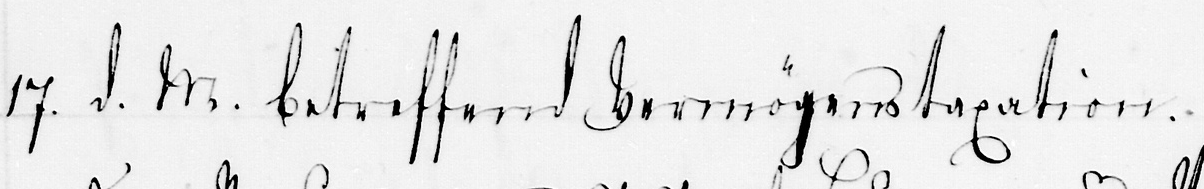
19. d. M. betreffend Vermögenstaxation.
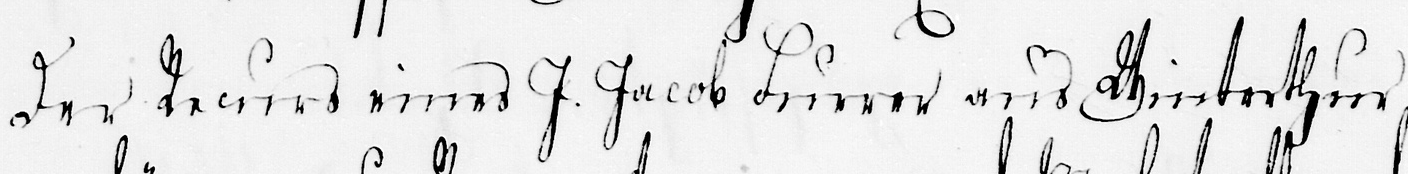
Der Recurs eines J. Jacob Furrer aus Winterthur
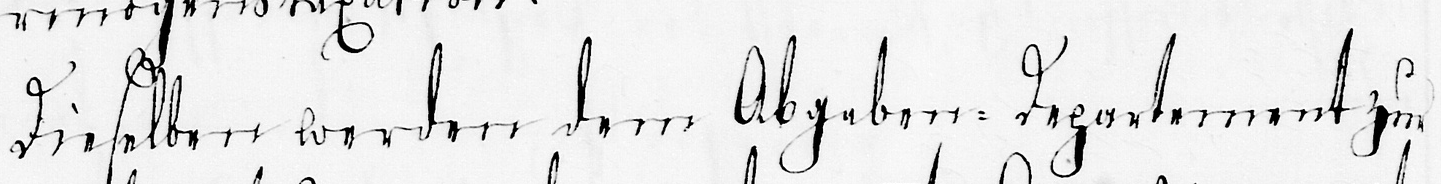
Dieselben werden dem Abgaben-Departement zur
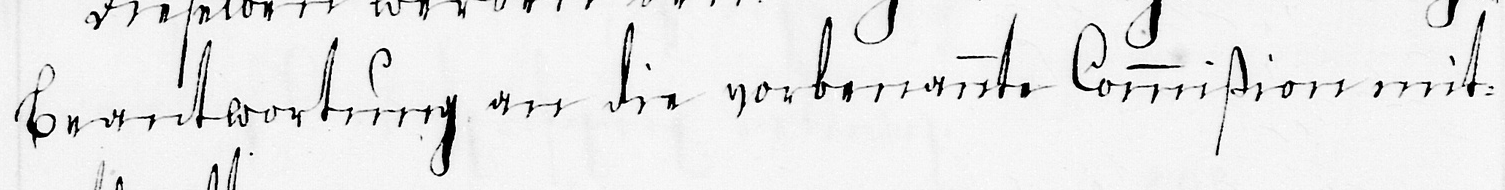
Beantwortung an die vorbenannte Commißion mit¬
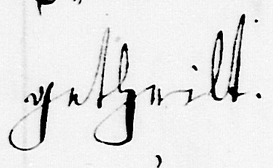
getheilt.
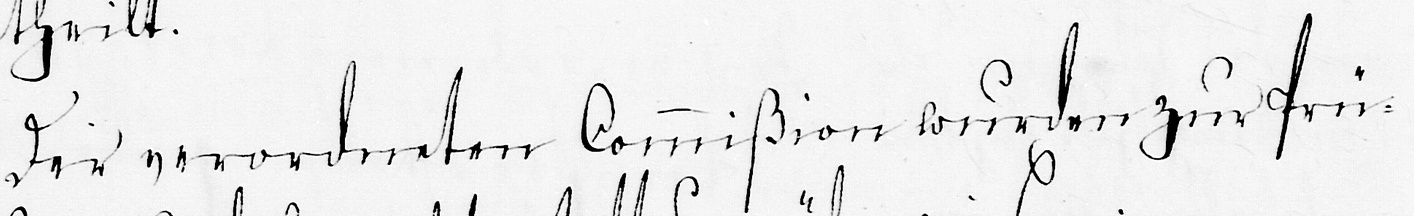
Der verordneten Commißion wurden zur Prü¬
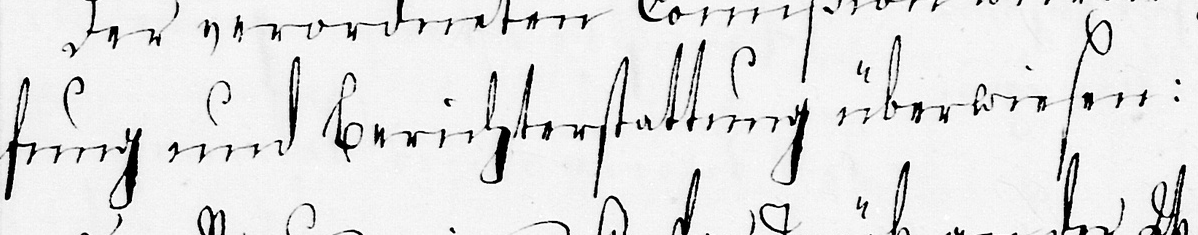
fung und Berichterstattung überwiesen:
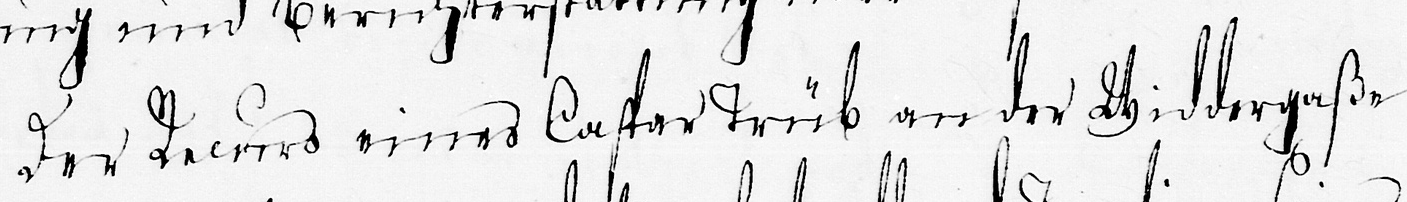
Der Recurs eines Caspar Trüb an der Widdergaße
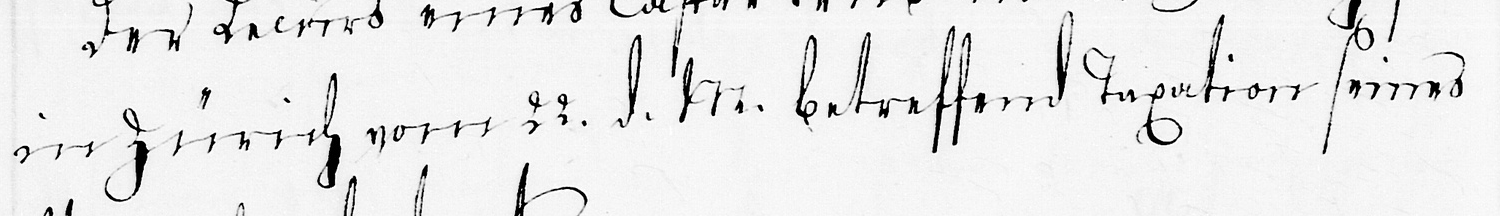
in Zürich vom 22. d. M. betreffend Taxation seines
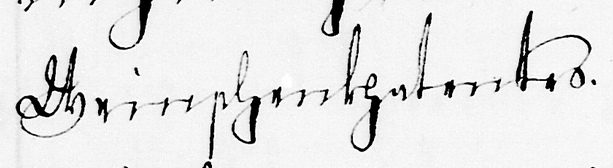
Weinschenkpatentes.
